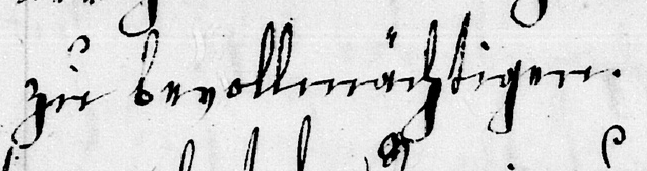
zu bevollmächtigen.
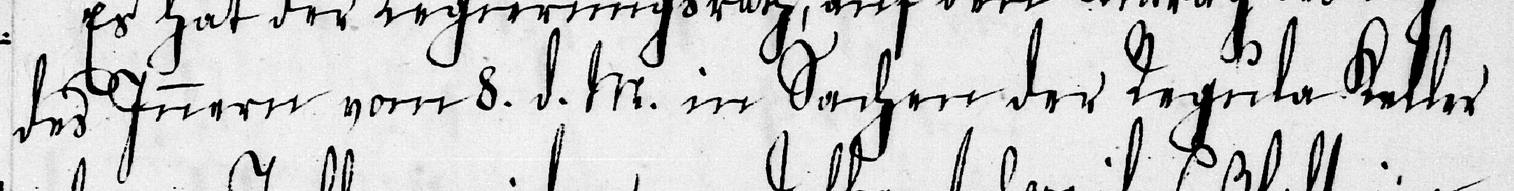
des Innern vom 8. d. M. in Sachen der Regula Keller
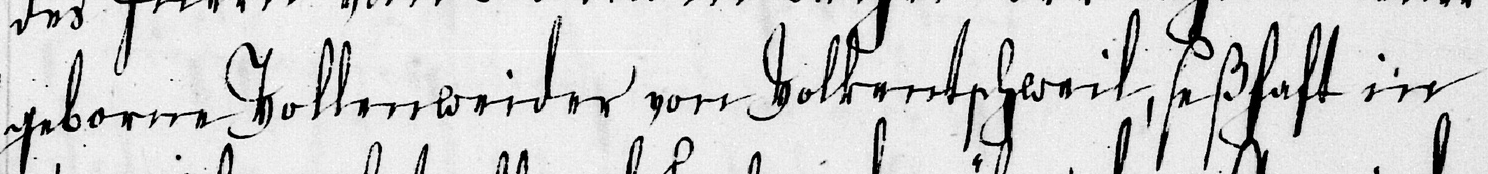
geborne Vollenweider von Volkentschweil, seßhaft in
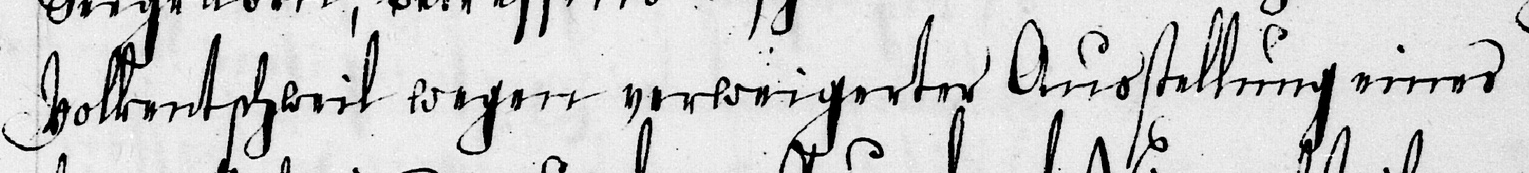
Volkentschweil wegen verweigerter Ausstellung eines
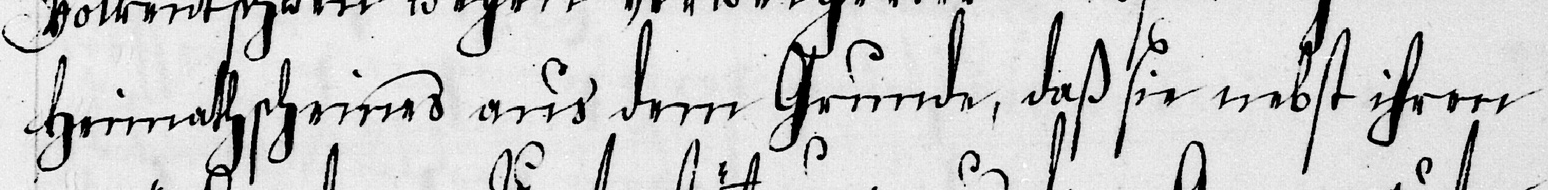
Heimathscheins aus dem Grunde, daß sie nebst ihren
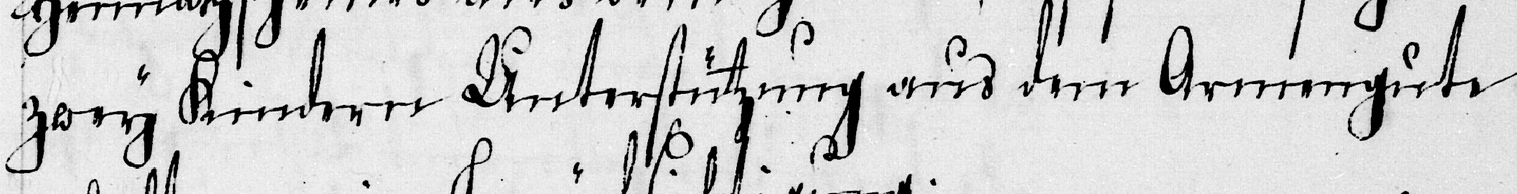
zwey Kindern Unterstützung aus dem Armengute
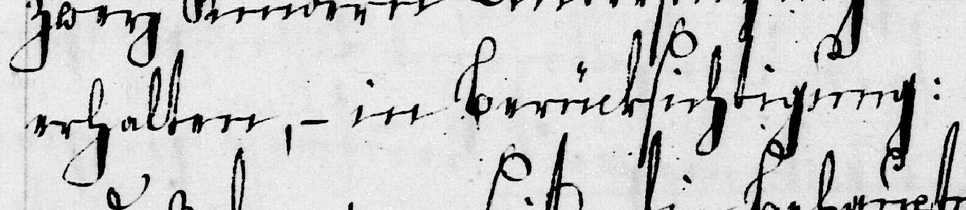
erhalten, – in Berücksichtigung:
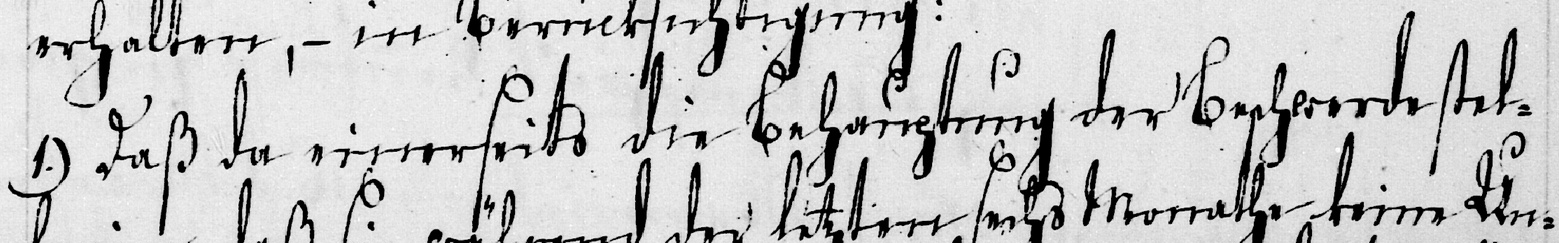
1.) Daß da einerseits die Behauptung der Beschwerdestel¬
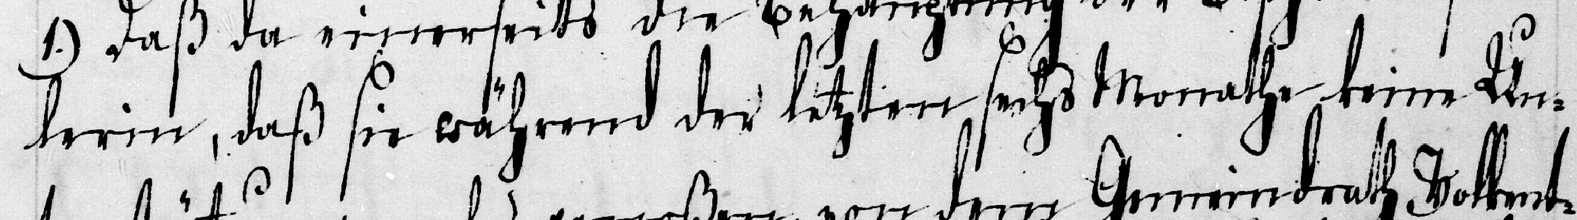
lerin, daß sie während der letzten sechs Monathe keine Un¬
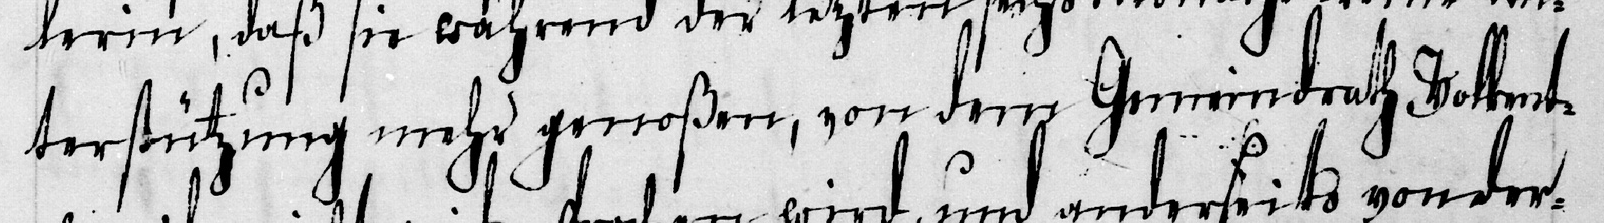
terstützung mehr genoßen, von dem Gemeindrath Volkent¬
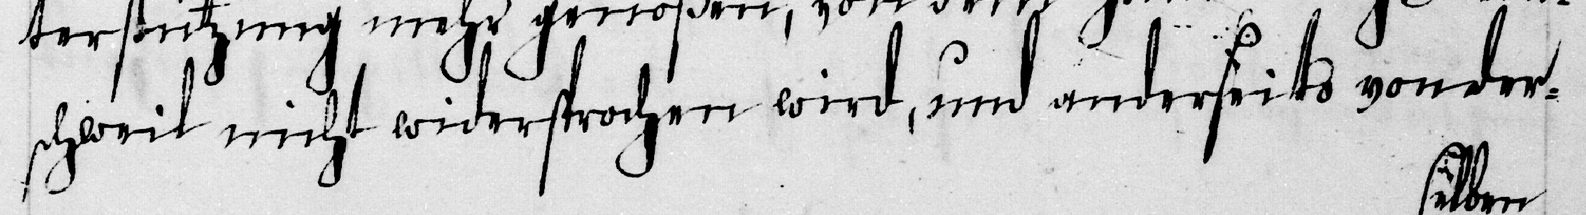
schweil nicht widersprochen wird, und anderseits von der-
